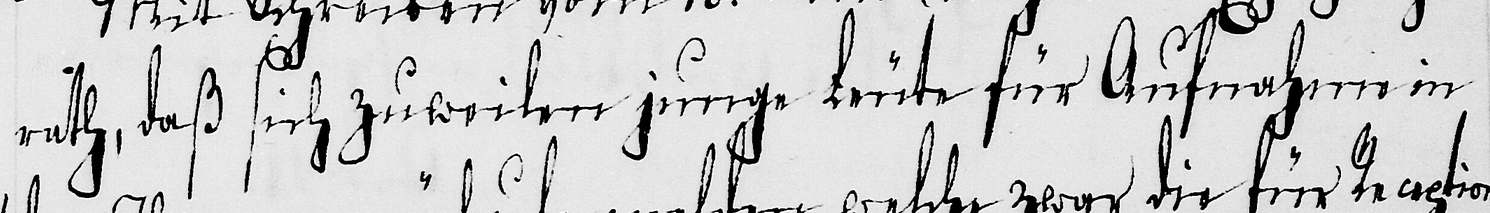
rath, daß sich zuweilen junge Leute für Aufnahme in
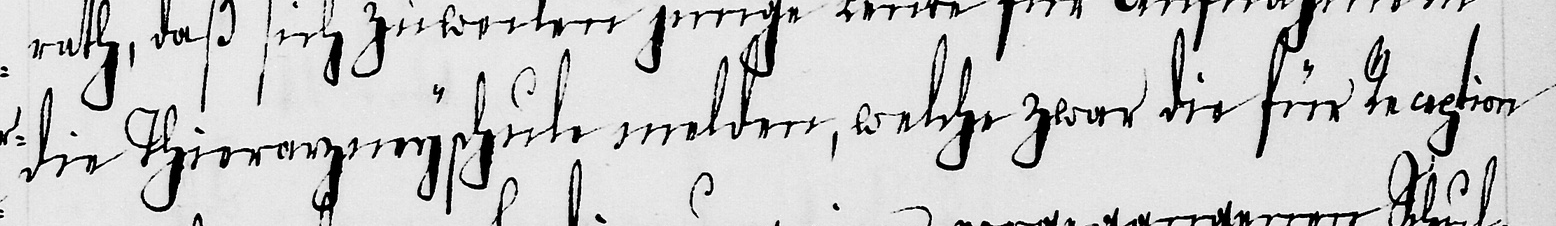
die Thierarzneyschule melden, welche zwar die für Reception
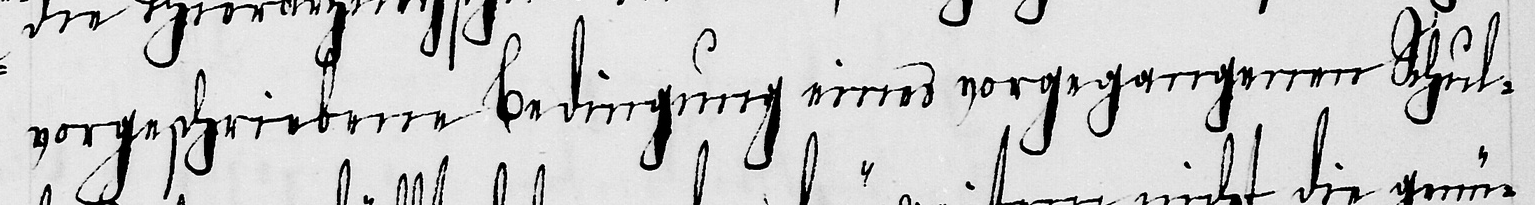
vorgeschriebene Bedingung eines vorgegangenen Schul¬
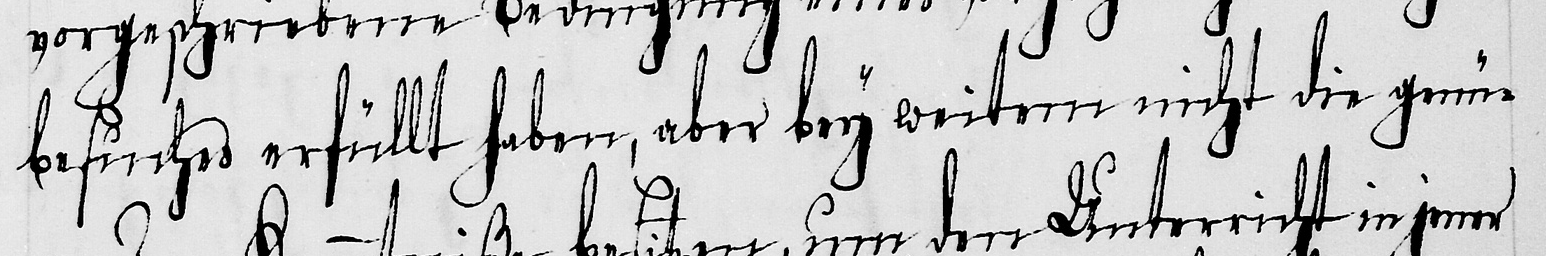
besuches erfüllt haben, aber bey weitem nicht die genü¬
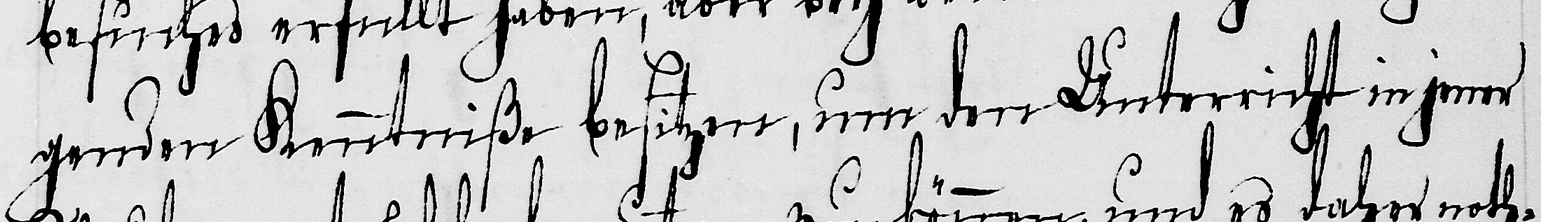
genden Kenntniße besitzen, um den Unterricht in je¬
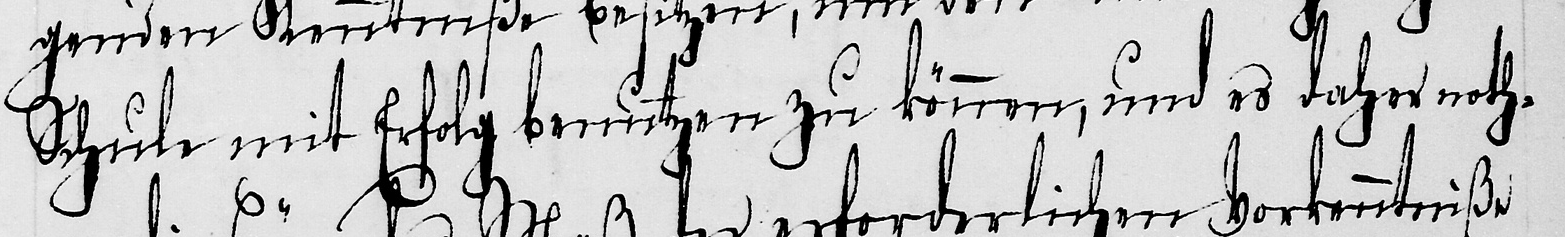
Schule mit Erfolg benutzen zu können, und es daher noth¬
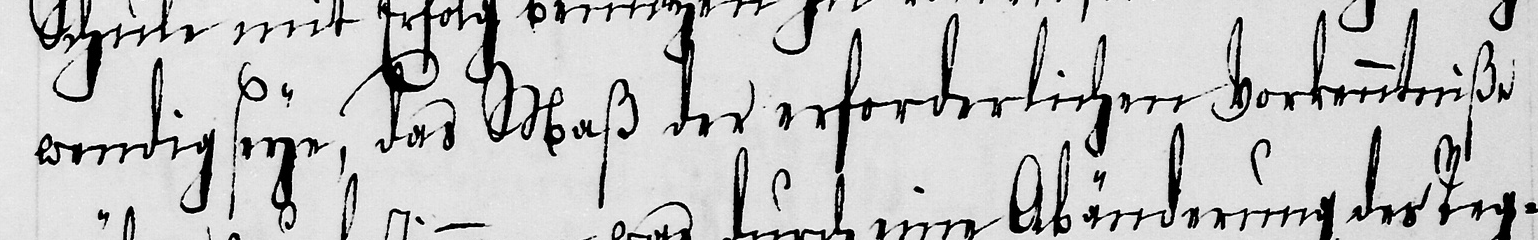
wendig seye, das Maß der erforderlichen Vorkenntniße
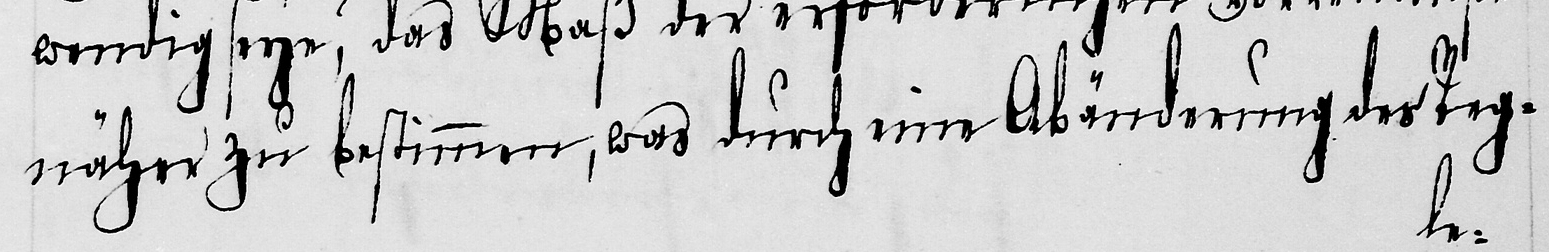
näher zu bestimmen, was durch eine Abänderung des Reg-
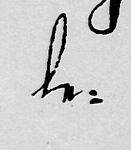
ner
